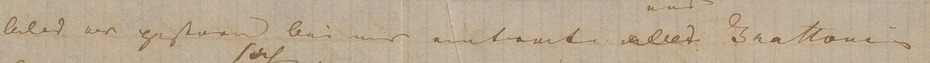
Als er gestern bei mir antrat alsundGrattoni
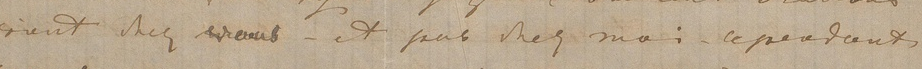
vient chez vous – et pas chez moi – cependant
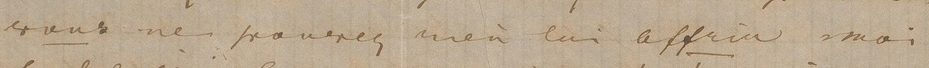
vous ne pouvez rien lui offrir moi
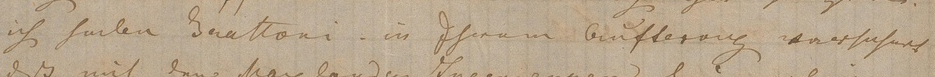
«Ich habe Grattoni – in Ihrem Auftrag versichert
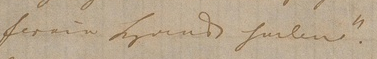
freie Hand habe».
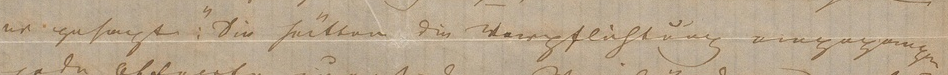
er gesagt:«Sie hätten die Verpflichtung eingegangen
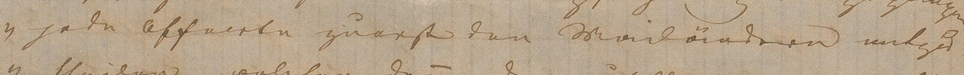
jede Offerte zuerst den Mailändern mitzu-
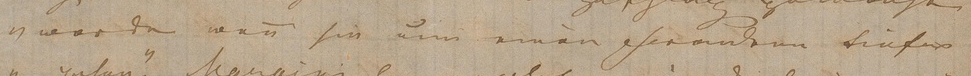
werde wenn sie um einen Franken tiefer
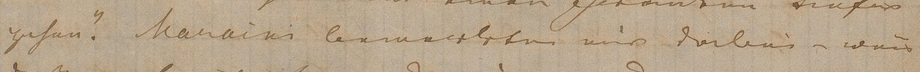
gehen». Maraini bemerkte mir dabei – wenn
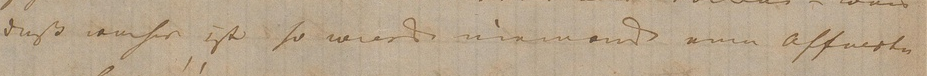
dieß mehr ist so wird niemand eine Offerte
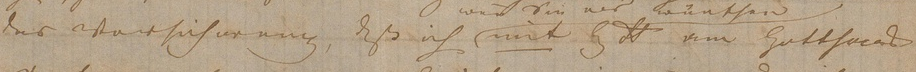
der Versicherung, daß ich wenn Sie es wünschenmit Herrn St am Gotthard -
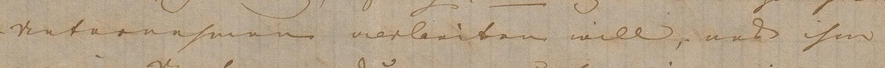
Unternehmen arbeiten will, und ihm
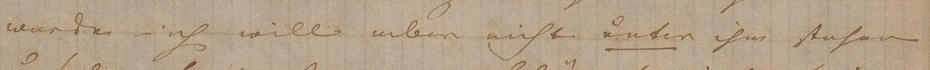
werde – ich will aber nicht unter ihm stehen
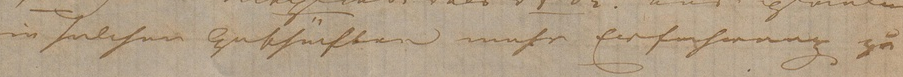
in solchen Geschäften mehr Erfahrung zu
